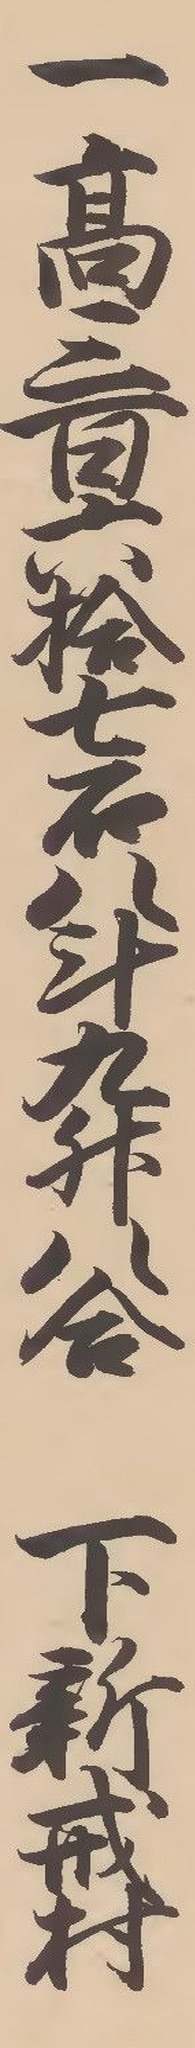一高三百六拾七石八斗九升八合下新戒村
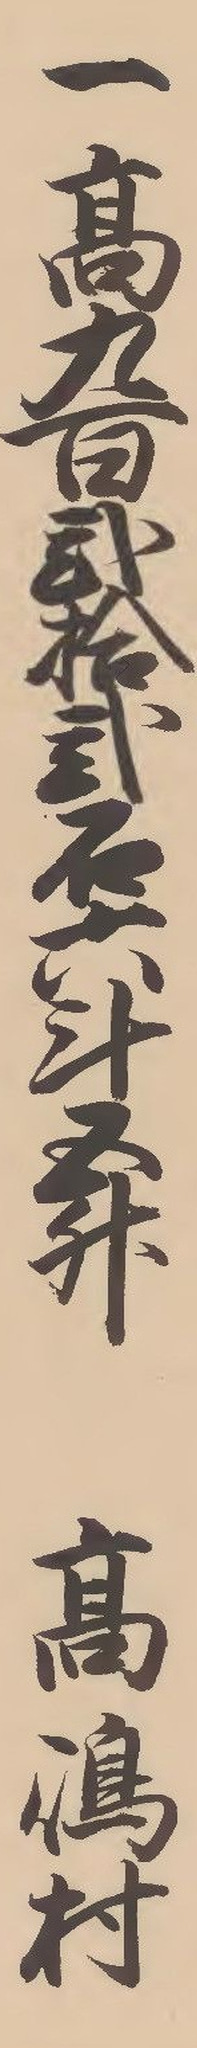一高九百弐拾弐石六斗五升高嶋村
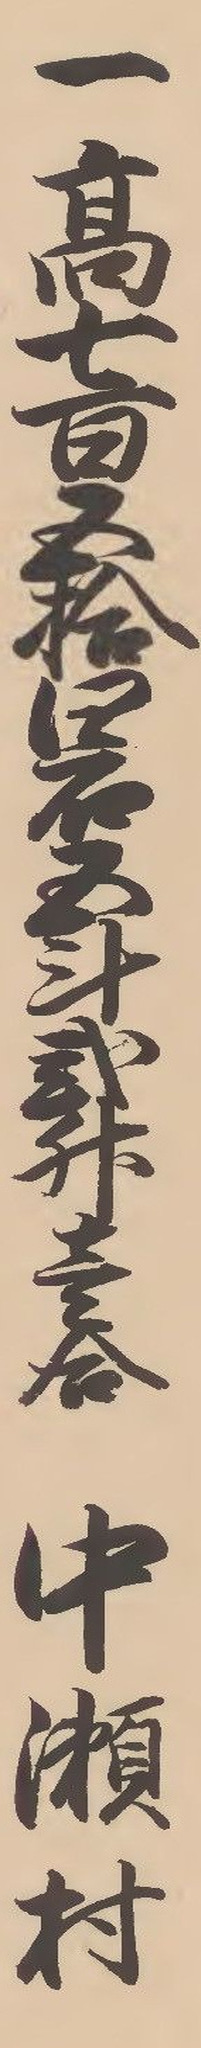一高七百五拾四石五斗弐升壱合中瀬村
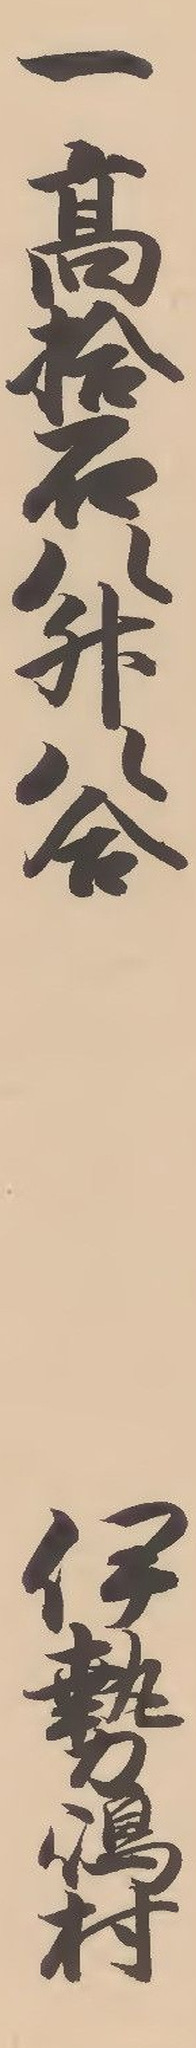一高拾石八升八合伊勢嶋村
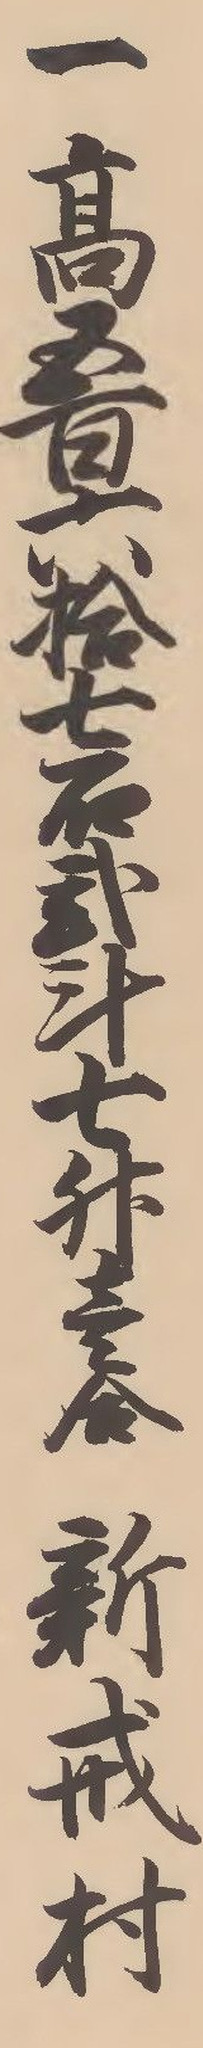一高五百六拾七石弐斗七升壱合新戒村
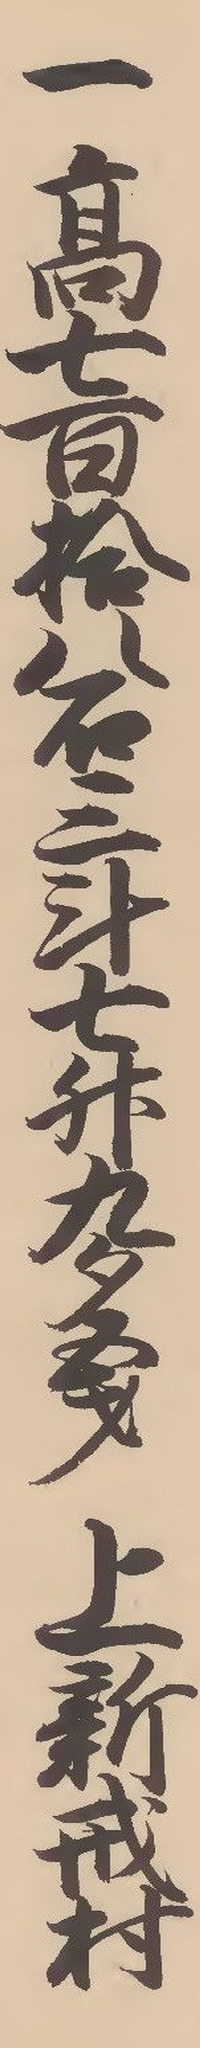一高七百拾八石三斗七升九勺五才上新戒村
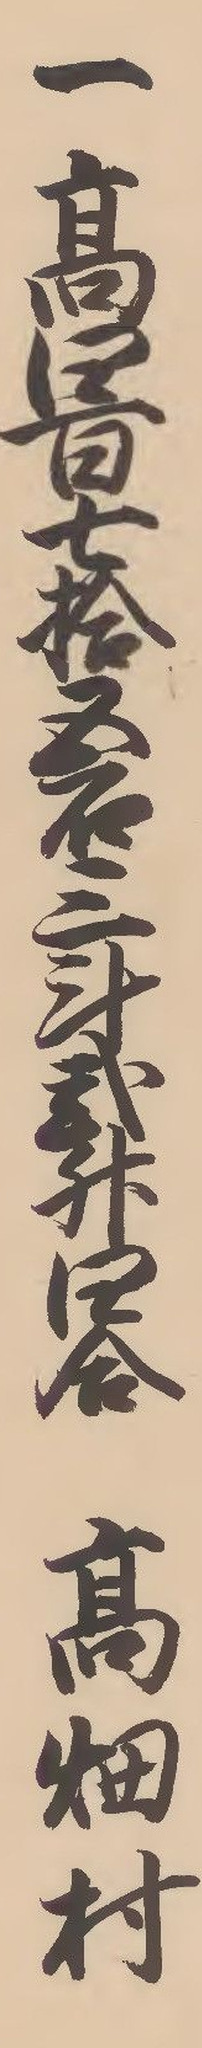一高四百七拾五石三斗弐升四合高畑村

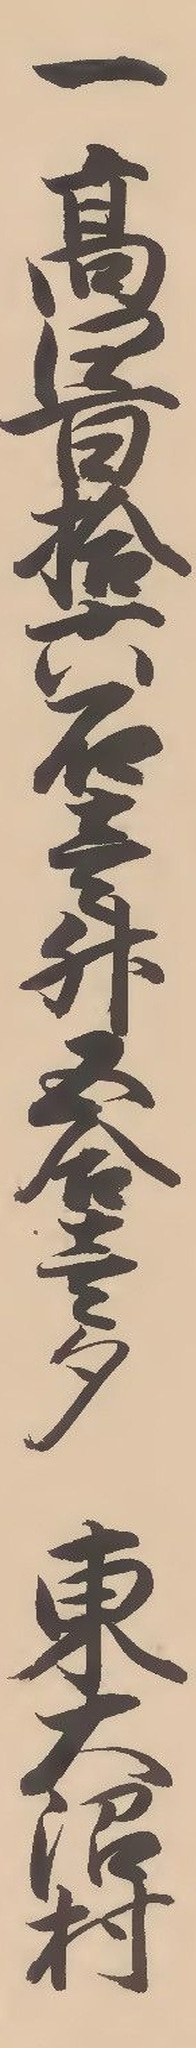一高四百拾六石壱升五合壱勺東大沼村
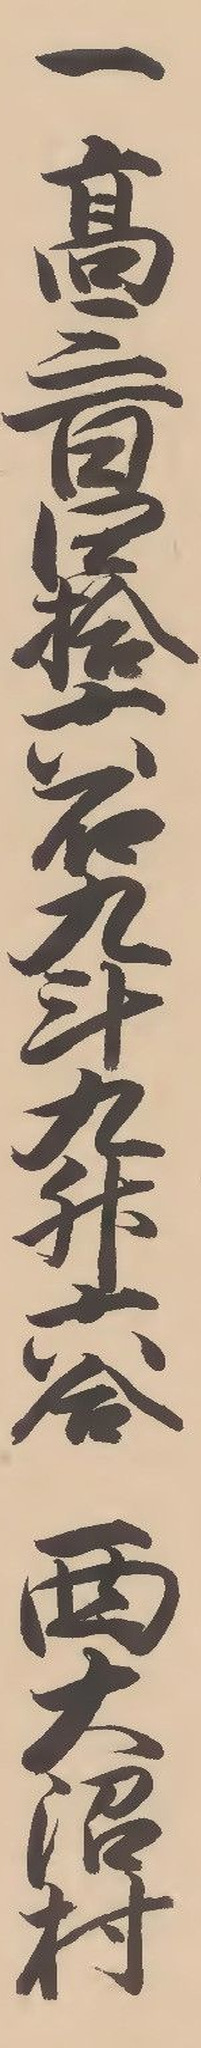一高三百四拾六石九斗九升六合西大沼村
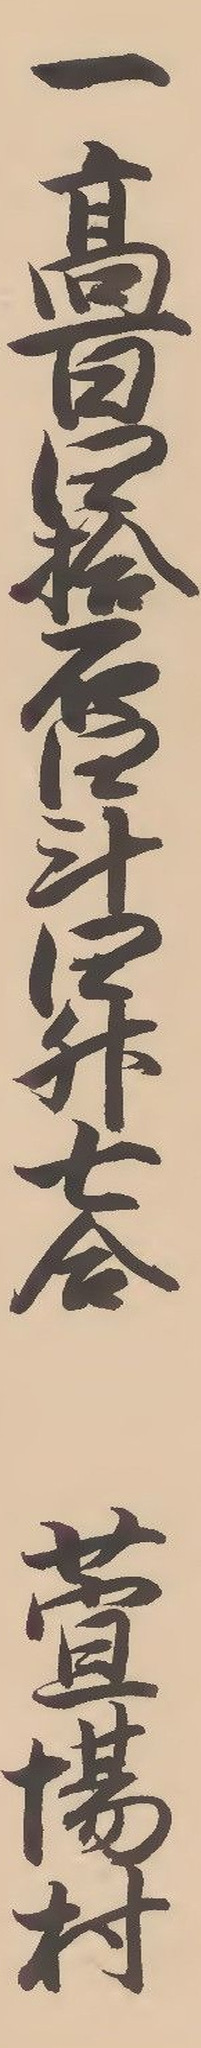一高百四拾石四斗四升七合萱場村
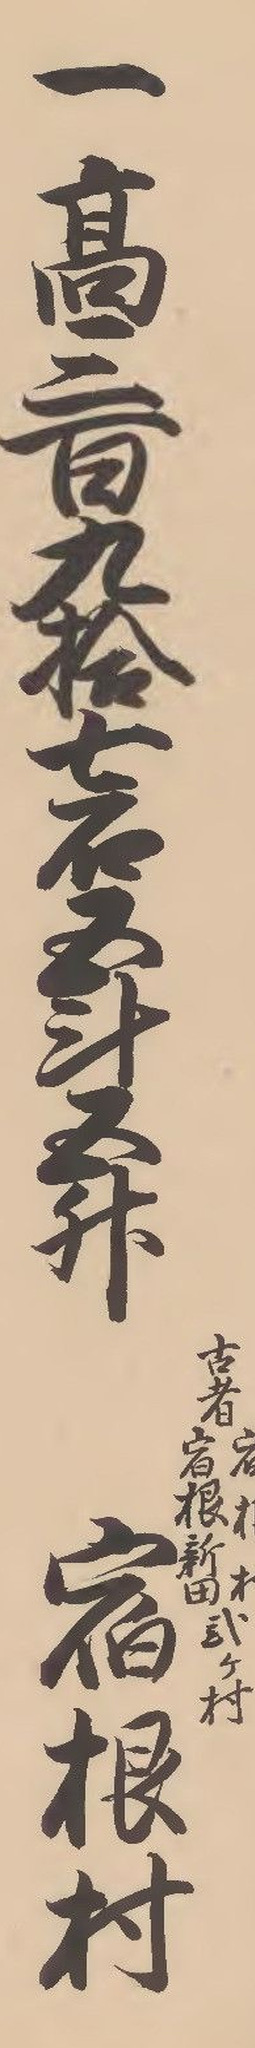一高三百九拾七石五斗五升宿根村
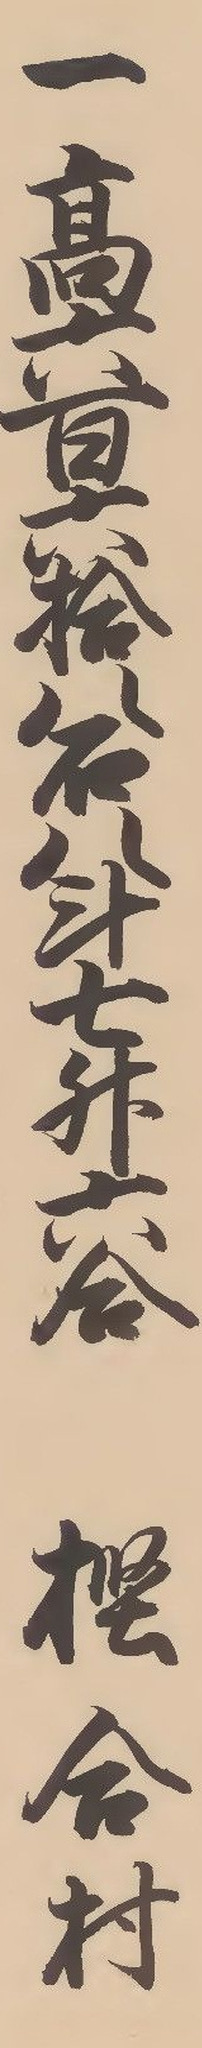一高六百六拾八石八斗七升六合樫合村
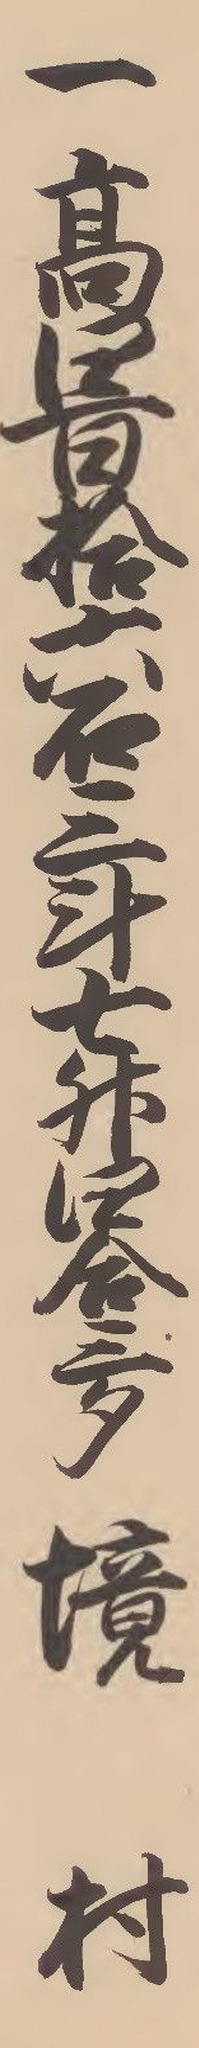一高四百拾六石三斗七升四合三勺境村

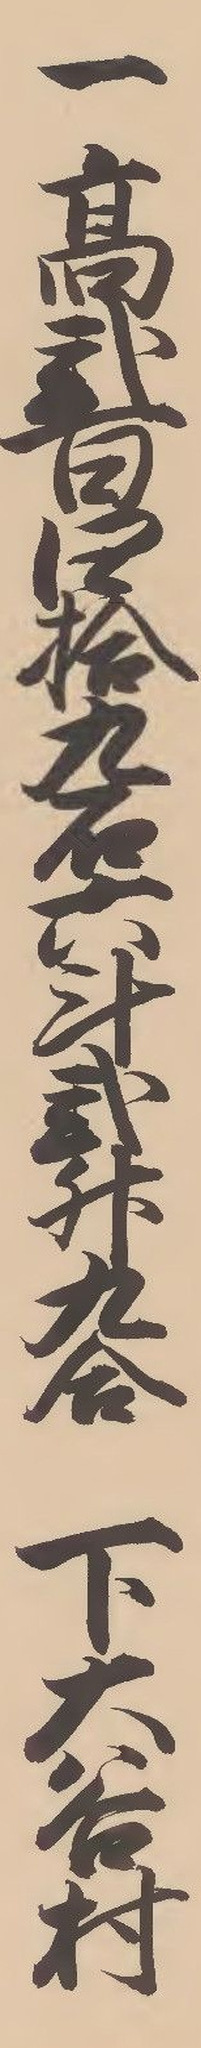一高弐百四拾九石六斗弐升九合下大谷村
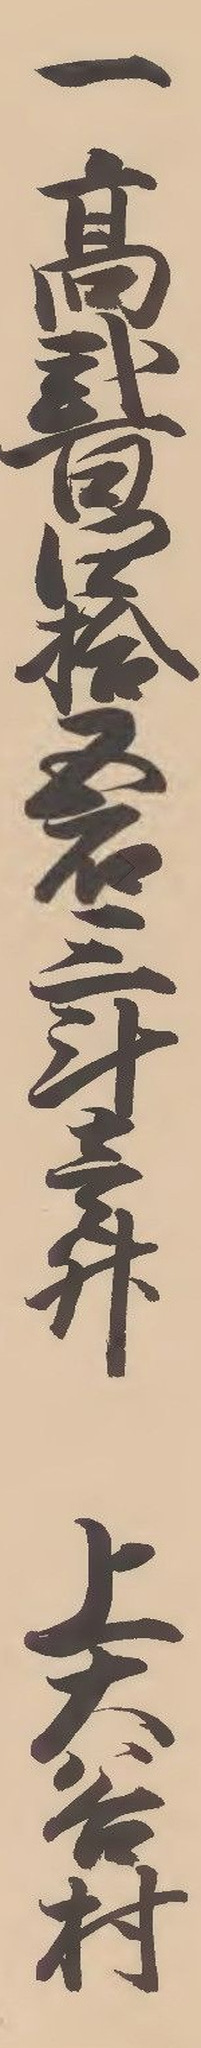一高弐百四拾五石三斗壱升上大谷村
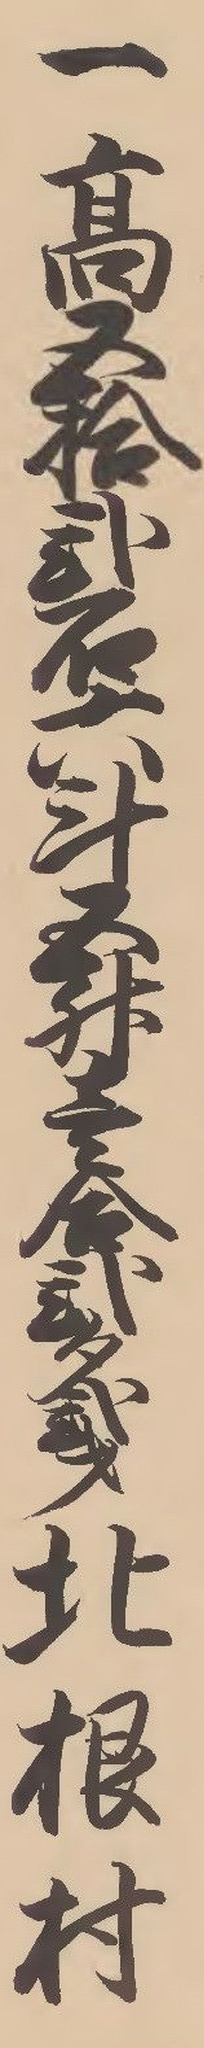一高五拾弐石六斗五升壱合弐勺弐才北根村
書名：武蔵国郷帳　下
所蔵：国立公文書館 National Archives of Japan
